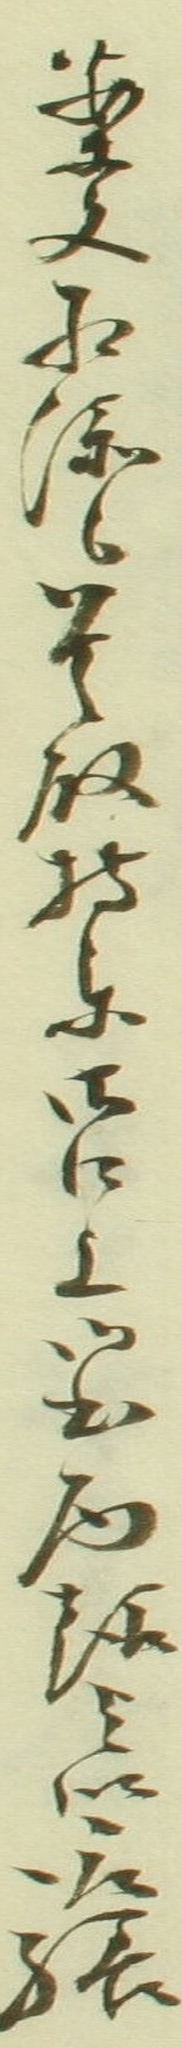案文相添候貴殿持参御口上御書面趣と御取繕
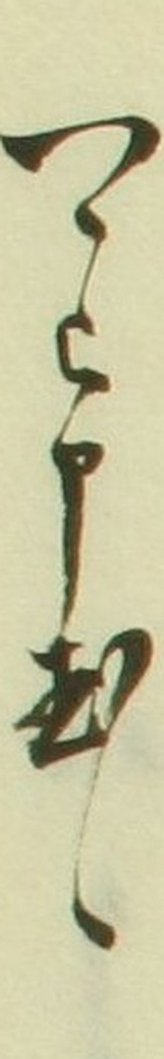可被申置候
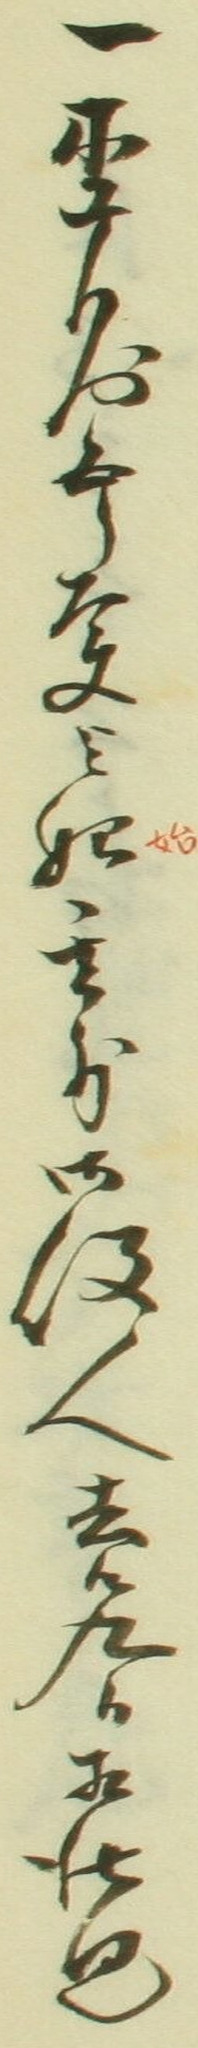一杢左衛門五郎太夫と始其外御役人去ル九日相仕廻

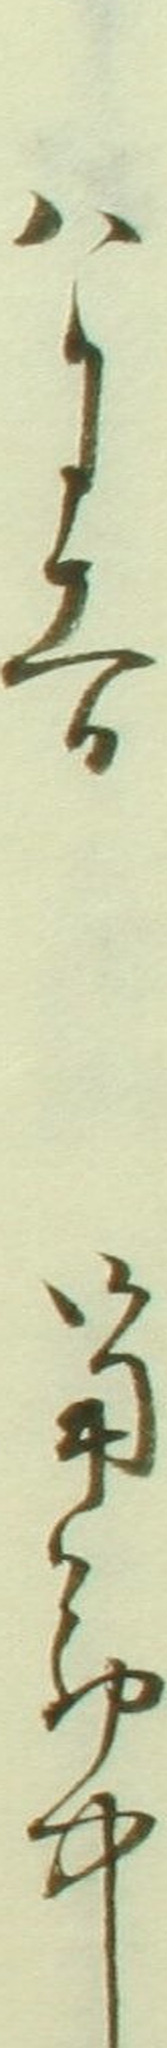八月十一日御用勤中
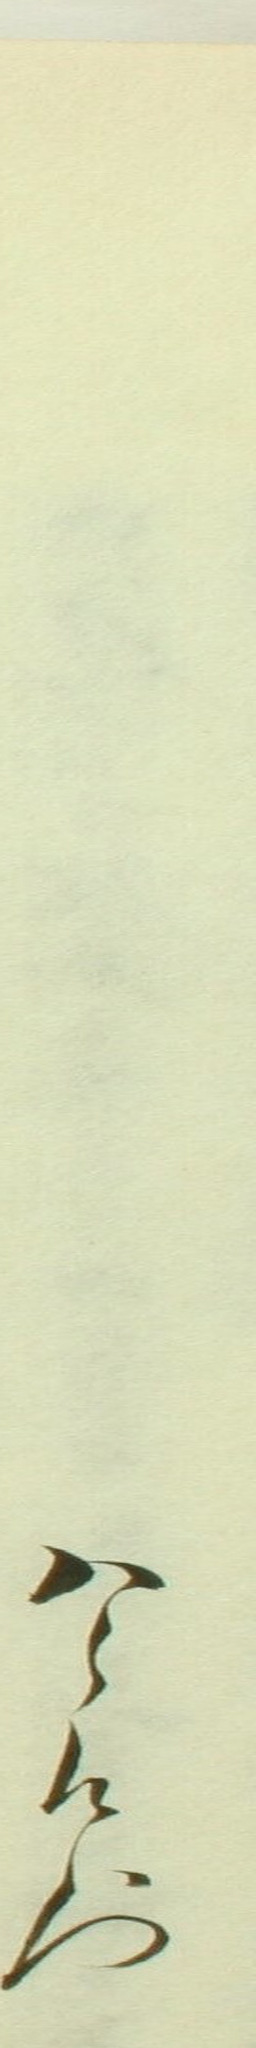八郎左衛門
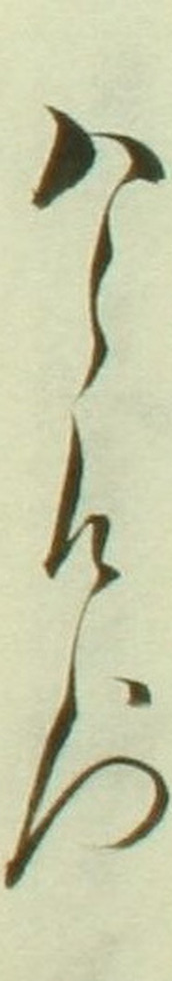八郎左衛門
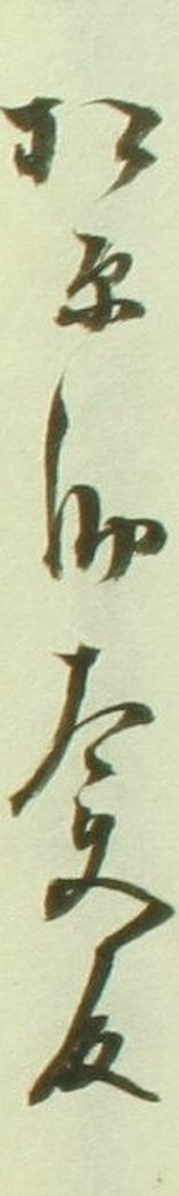松原助太夫殿
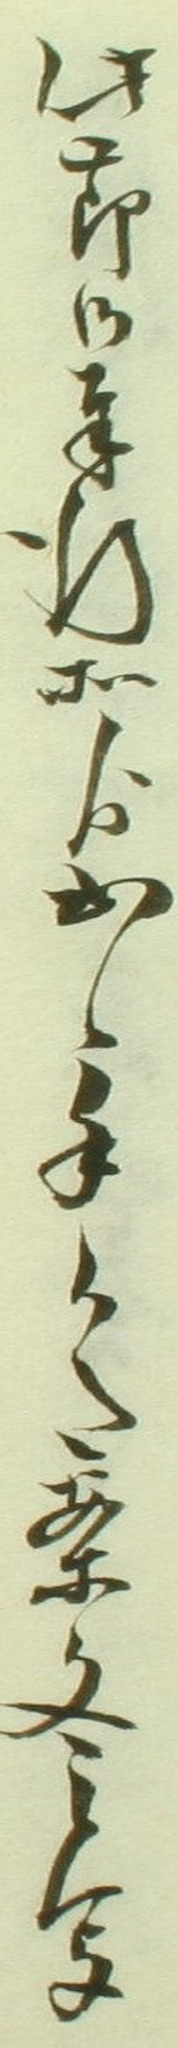此節御奉行所ゟ出候手かた案文之写
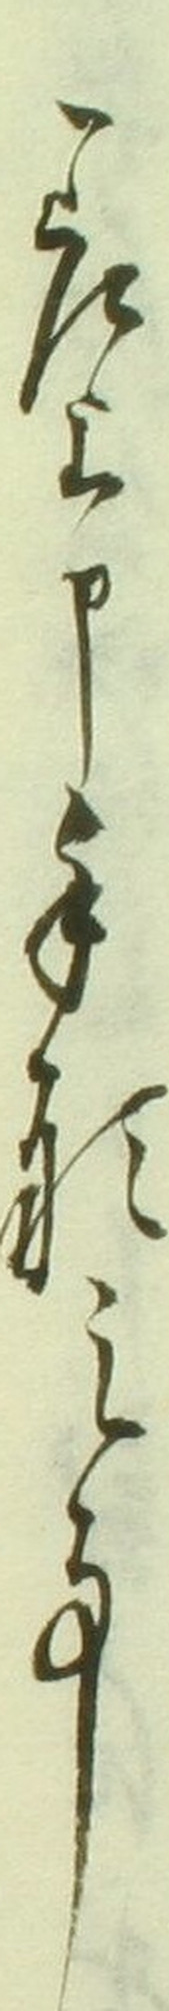差上申手形之事
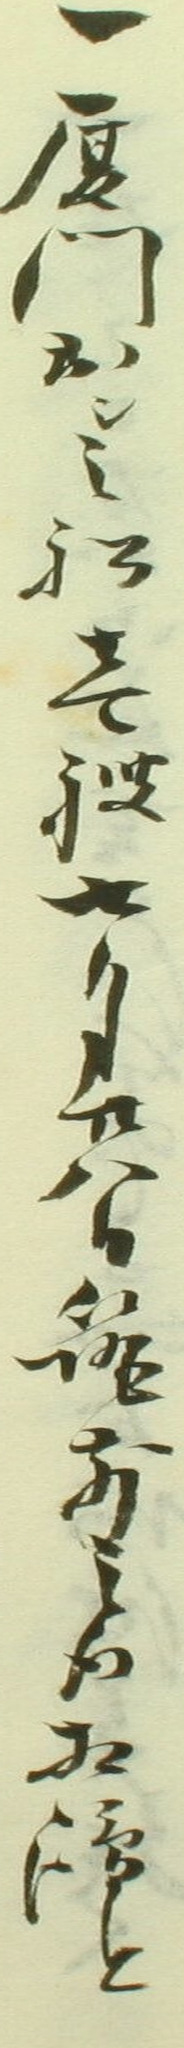一厦門出シ之船壱艘七月廿八日筑前之内相嶋と
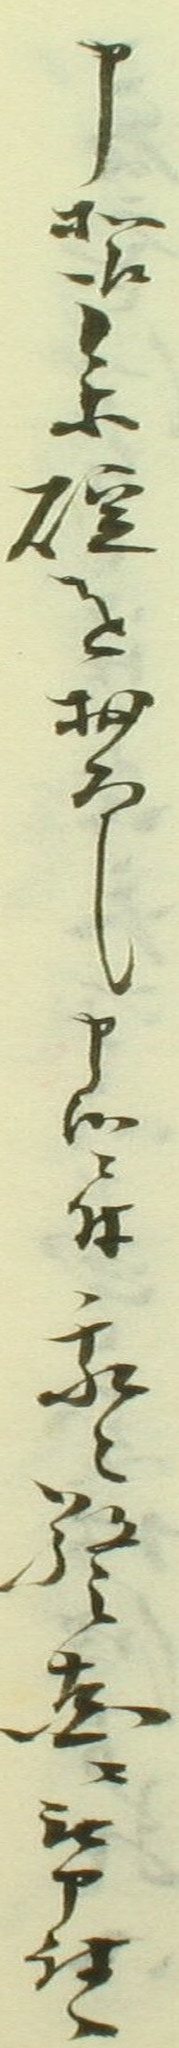申所江参碇をおろし申候ニ付我々警固ニ被申付候
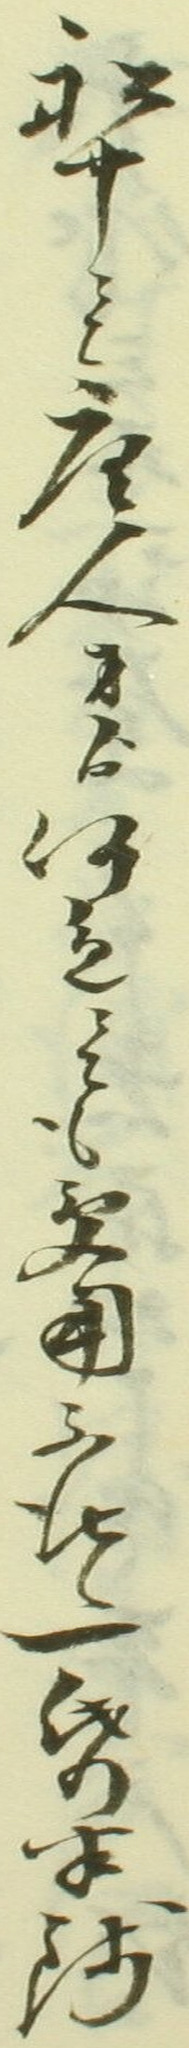船中ニて唐人等ゟ何辺ニても受用不仕候一紙半銭
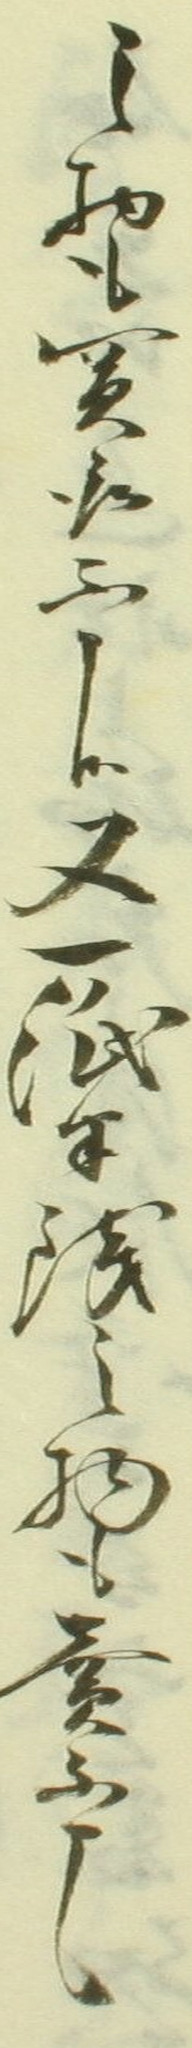之物も買取不申候又一紙半銭之物も売不申候
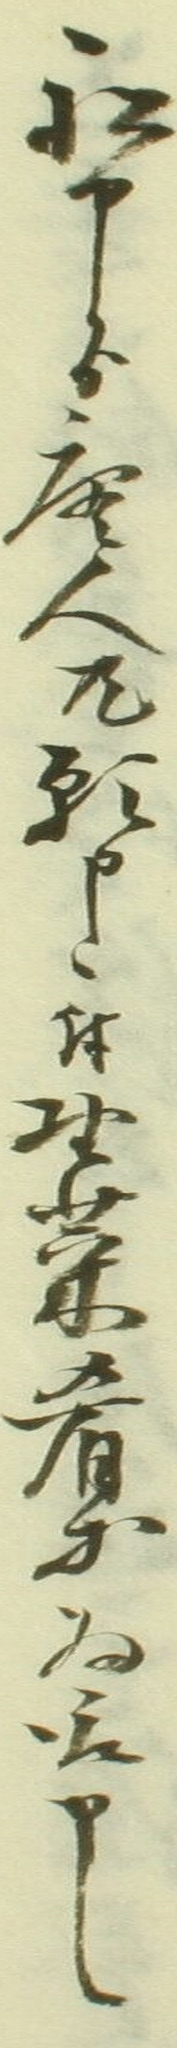船中ゟ唐人共願申候付野菜肴等為取申候
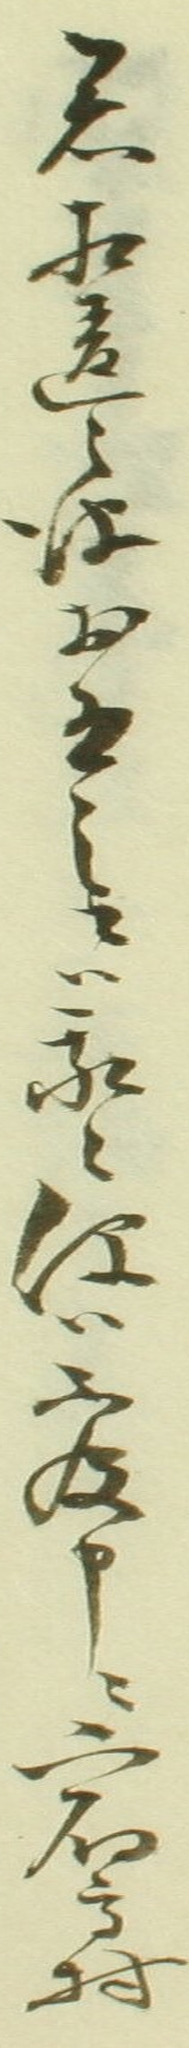若相違之儀於有之てハ我と彼ハ不申ニ宿高村
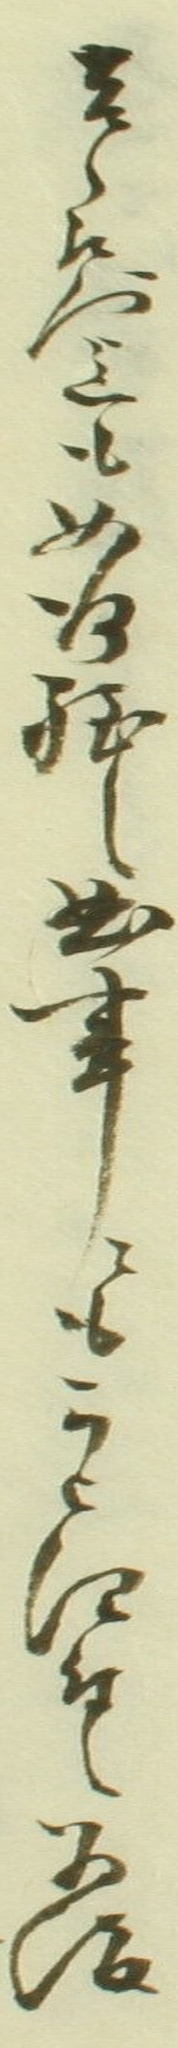吉郎左衛門も如何程之曲事ニも可被仰付候為後
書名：異国船漂着記
